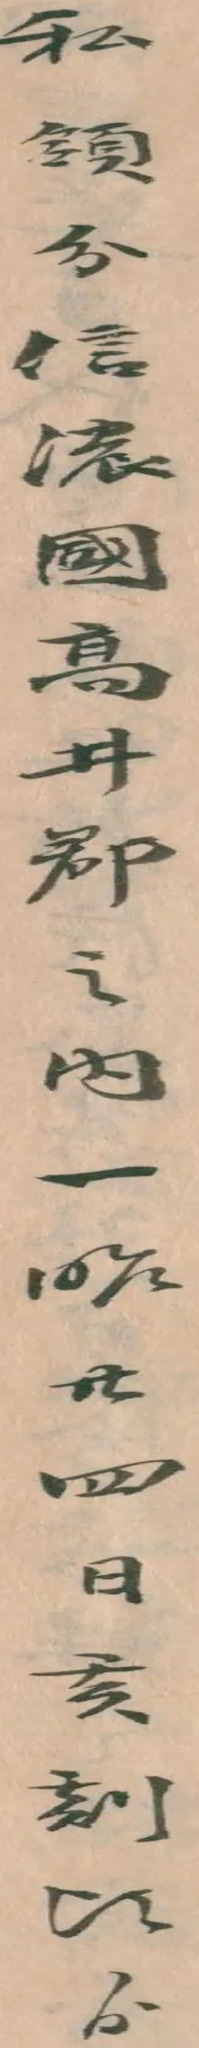私領分信濃国高井郡之内一昨廿四日亥刻比ゟ
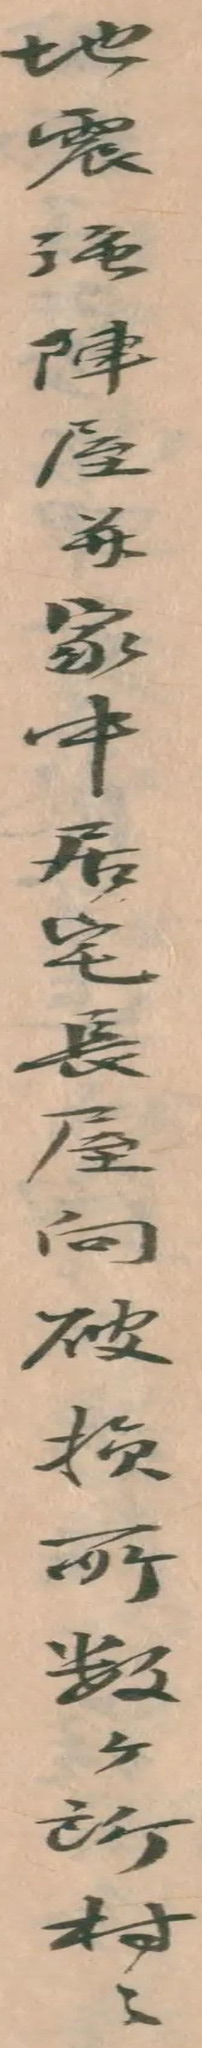地震強陣屋并家中居宅長屋向破損所数ヶ所村々
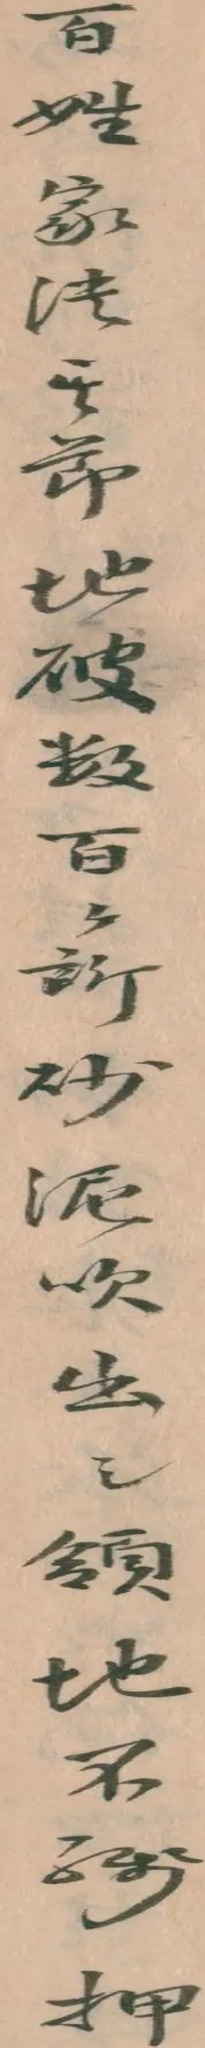百性家潰其節地破数百ケ所砂泥吹出し領地不残押
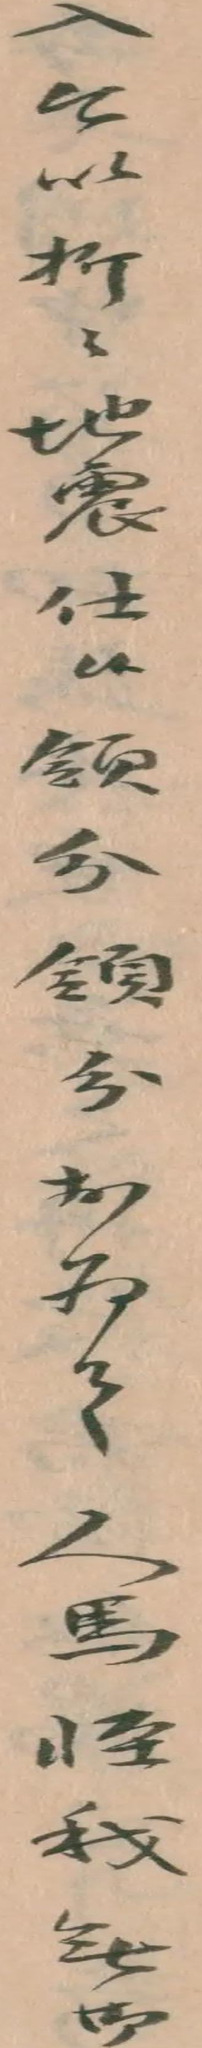入今以折々地震仕候領分領分おゐて人馬怪我無御
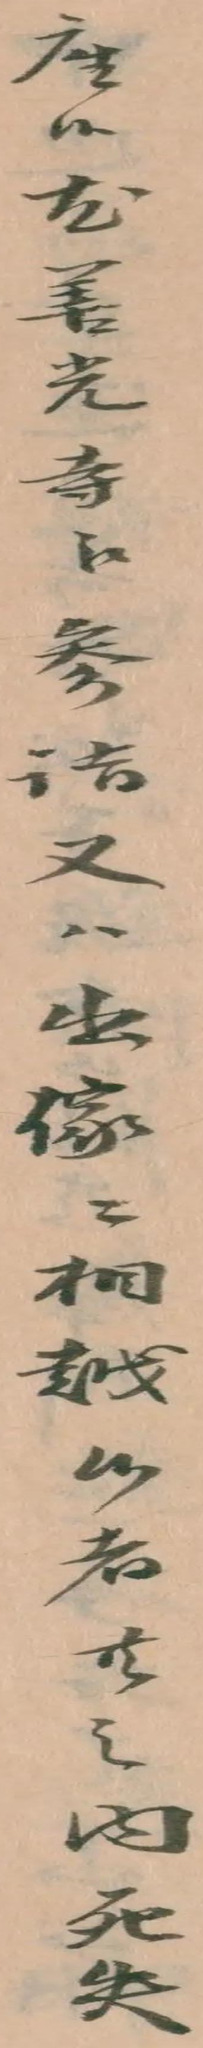座候尤善光寺へ参詣又ハ出稼二相越候者共之内死失
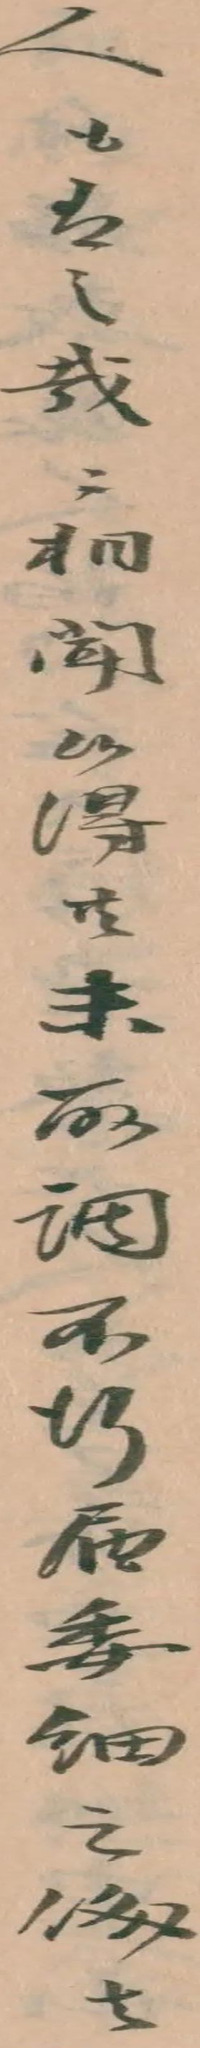人も有之哉ニ相聞候得共未取調不行届候委細之儀者
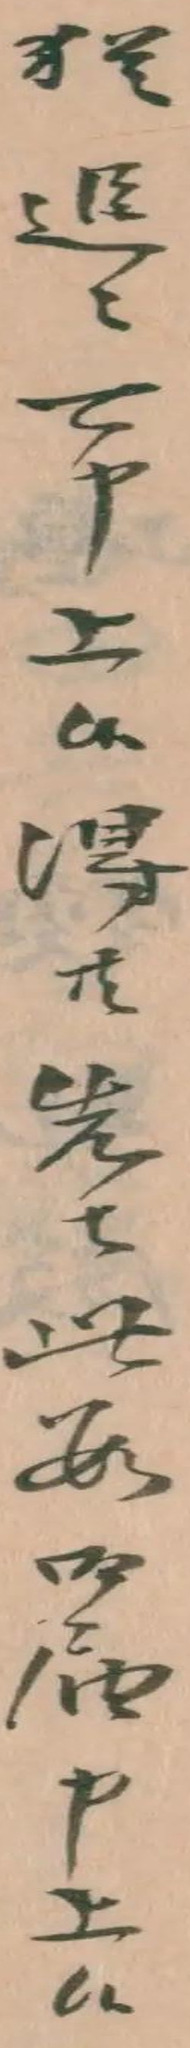猶追々可申上候得共先者此段御届申上候
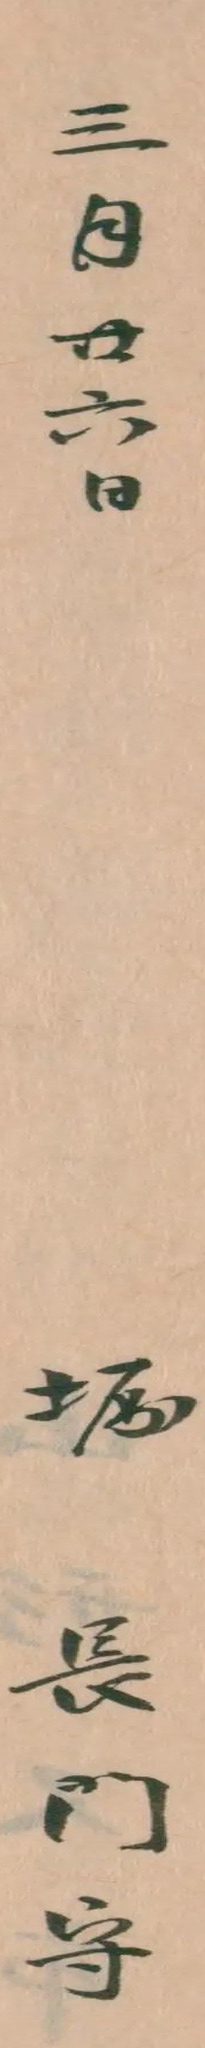三月廿六日堀長門守
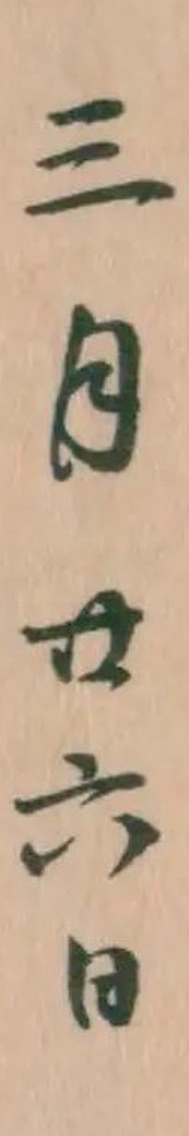三月廿五日
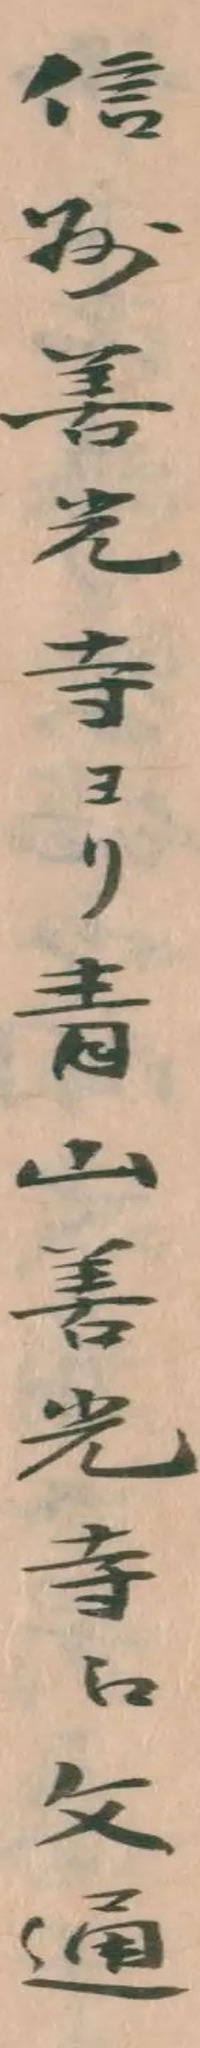信州善光寺ゟ江戸青山善光寺江文通
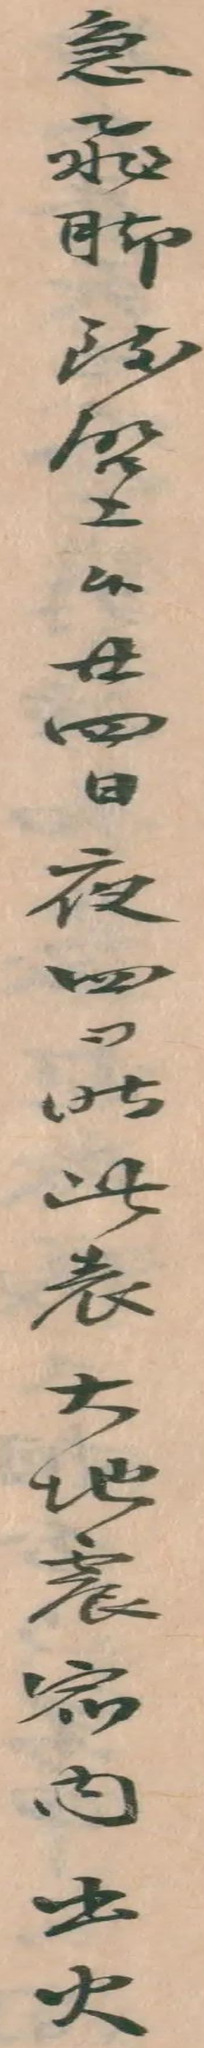急飛脚致啓上候廿四日夜四ッ時此表大地震宿内出火
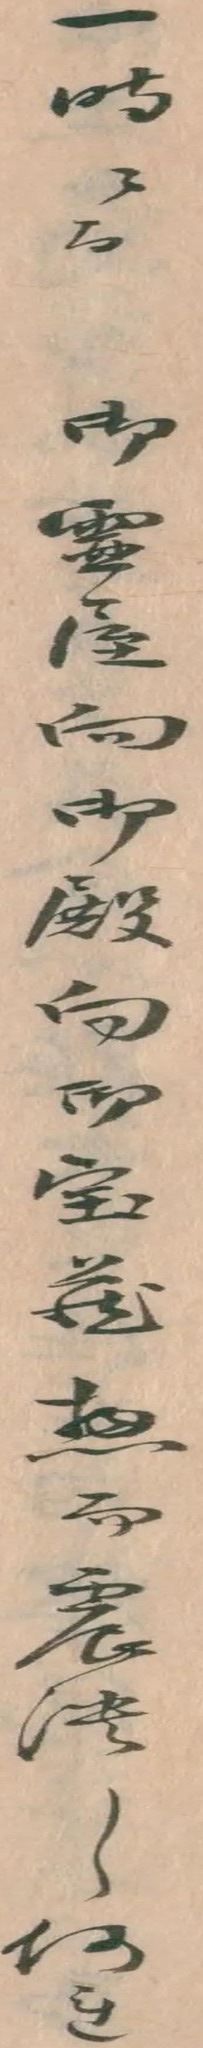一時二而御霊屋向御殿向御宝蔵惣而震潰し何れ
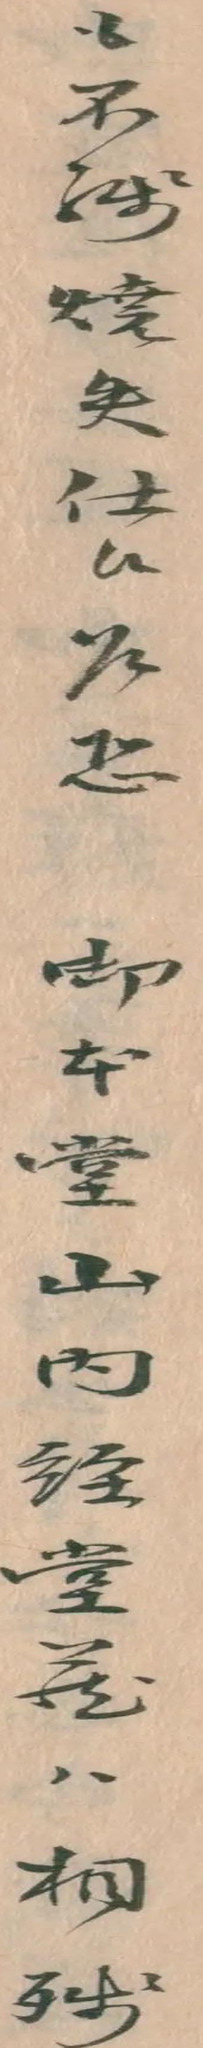も不残焼失仕候乍恐御本堂山内経蔵ハ相残
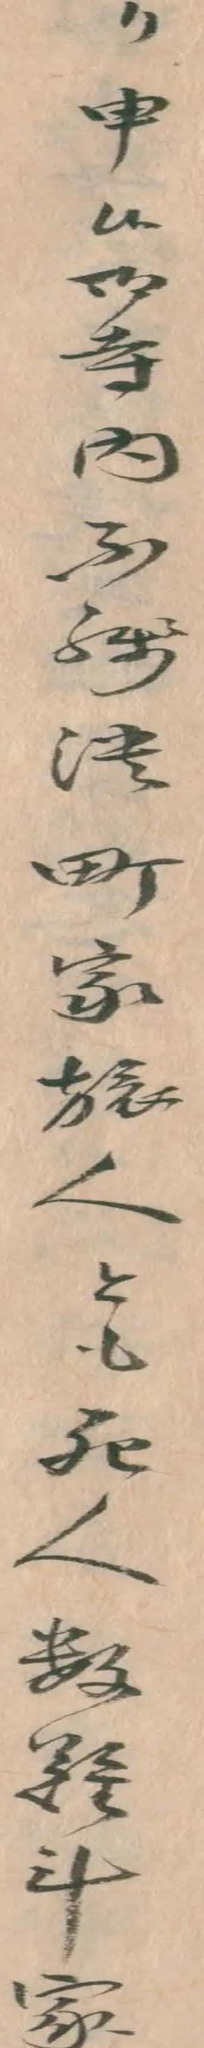り申候御寺内不残潰町家旅人とも死人数難斗家
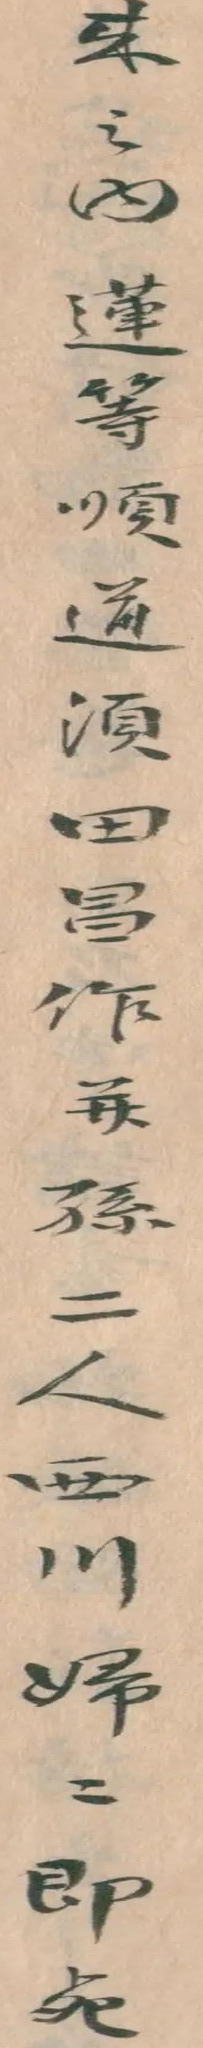来之内蓮等順道須田昌作并孫二人西川婦〃即死
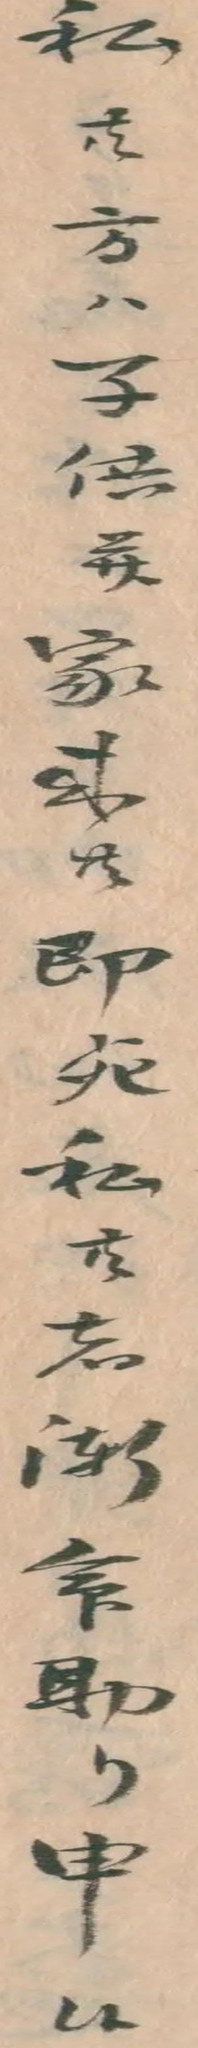私共方ハ子供并家来共即死私共者漸命助り申候
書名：地災撮要. 巻3(地震之部)-巻4(噴火之部)
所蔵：国立国会図書館 National Diet Library, JAPAN
